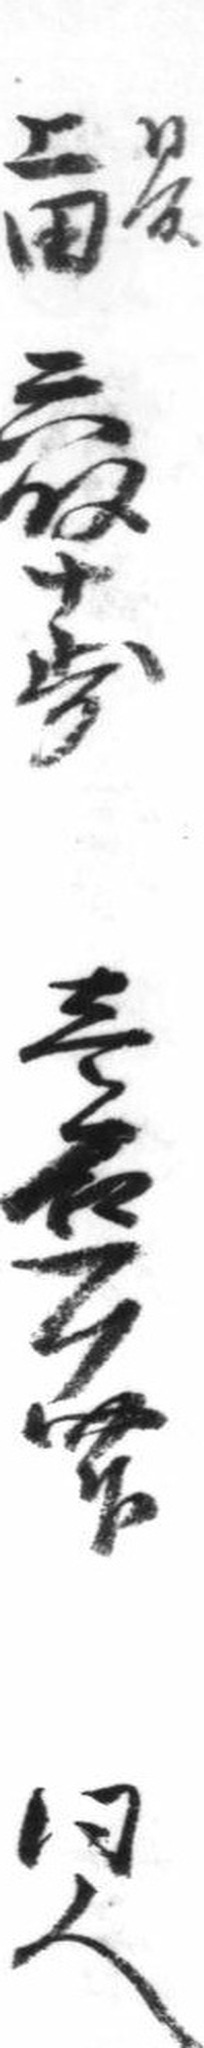上田六畝十歩壱石一斗四升同人
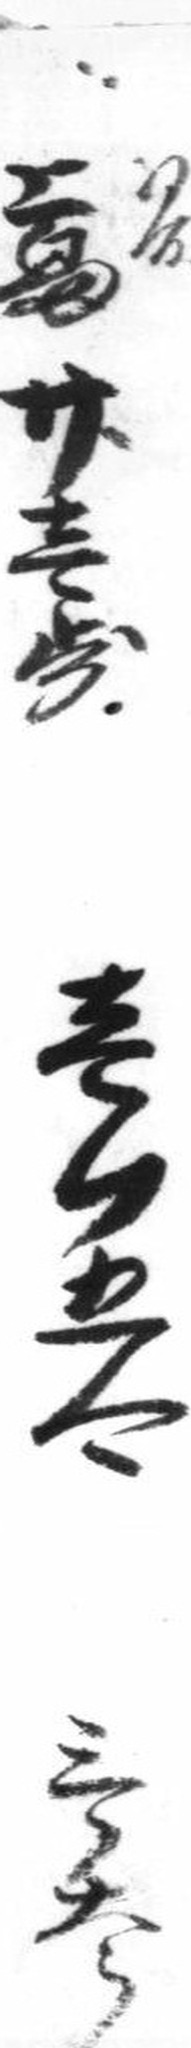上畠廿壱歩壱斗五合三郎太郎
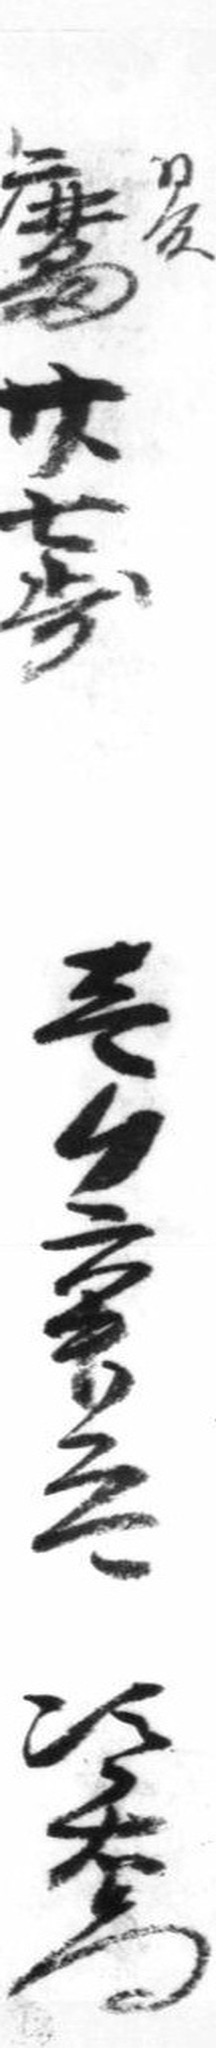麻畠廿七歩壱斗六升二合次郎右衛門

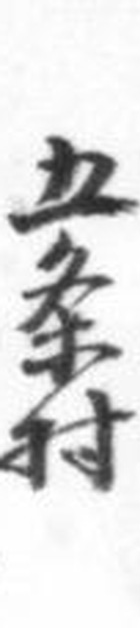五条村
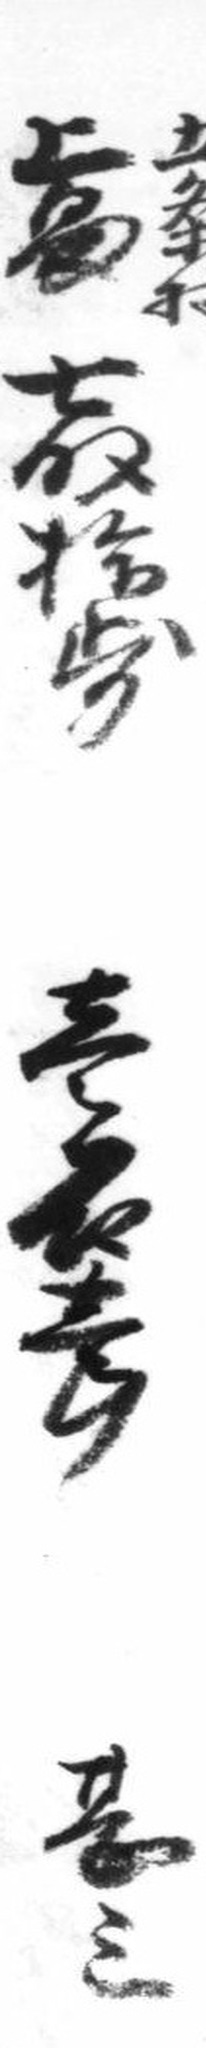上畠七畝拾歩壱石壱斗甚三
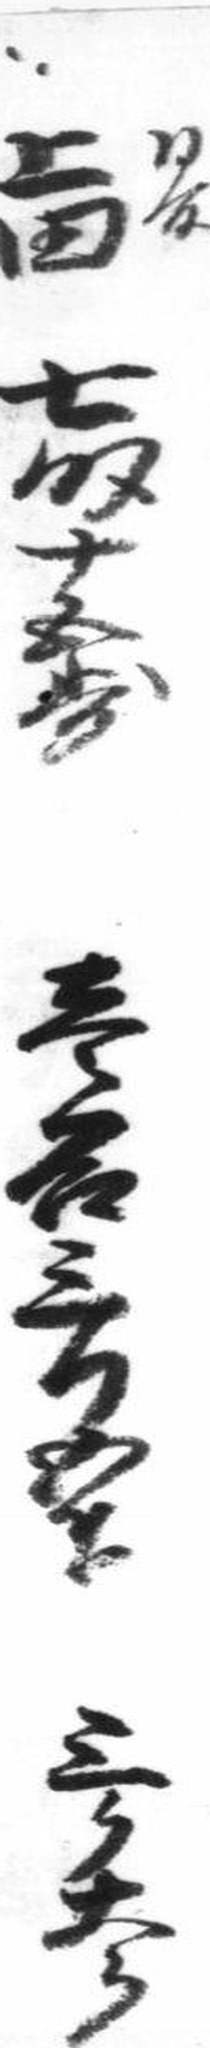上田七畝十五歩壱石三斗五升三郎太郎

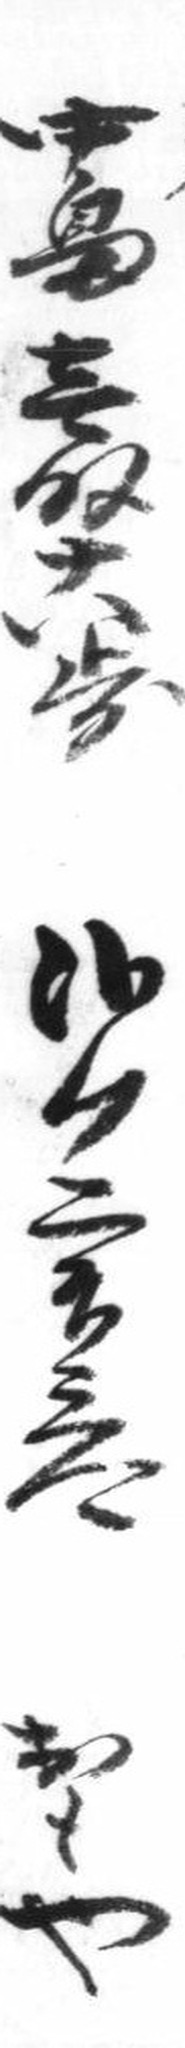中畠壱畝十八歩弐斗弐升三合出〆や
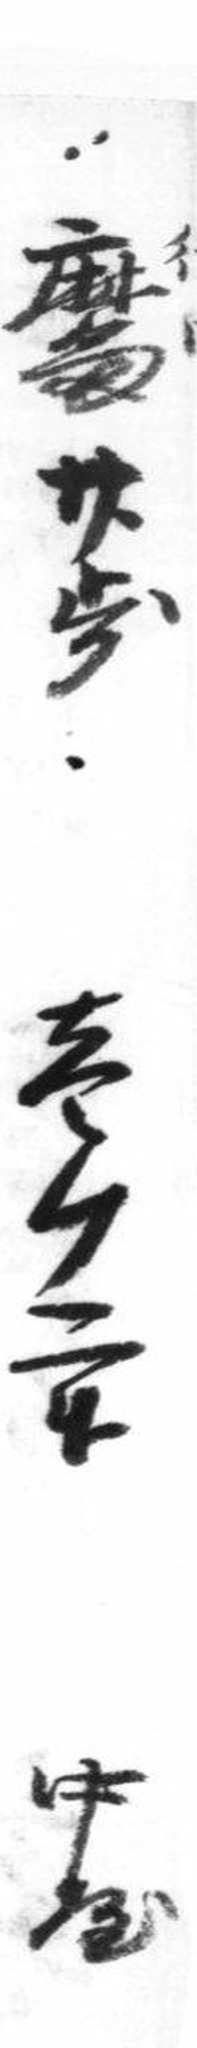麻畠廿歩壱斗二升中屋
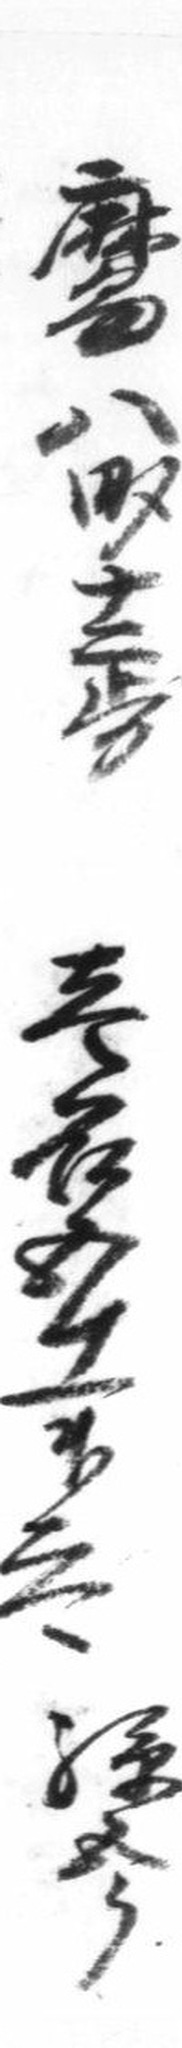麻畠八畝十二歩壱石五斗一升二合孫五郎

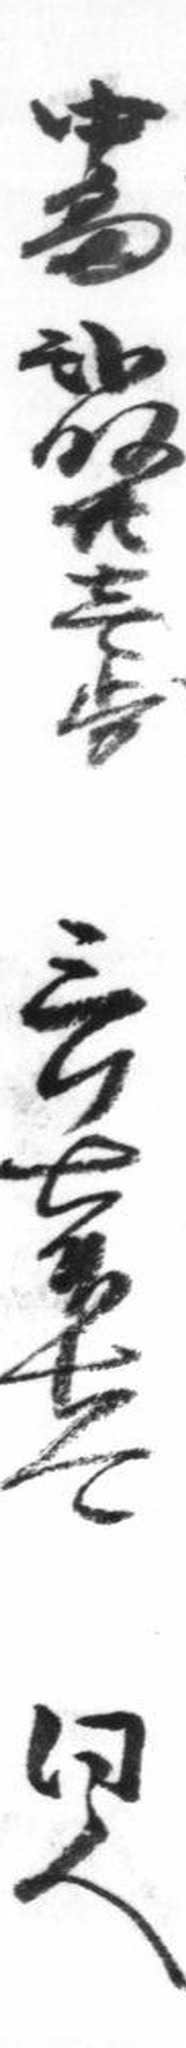中畠弐畝廿壱歩三斗七升七合同人
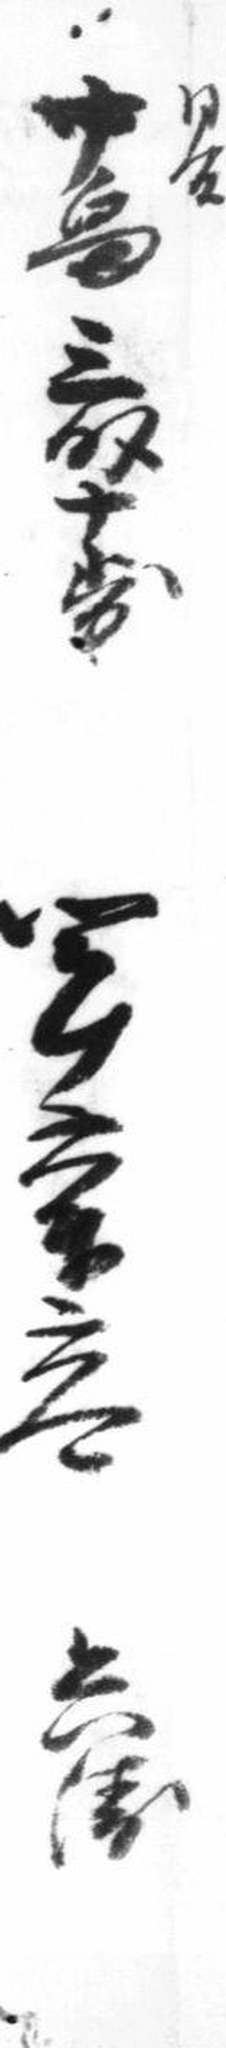中畠三畝十歩四斗六升六合兵衛
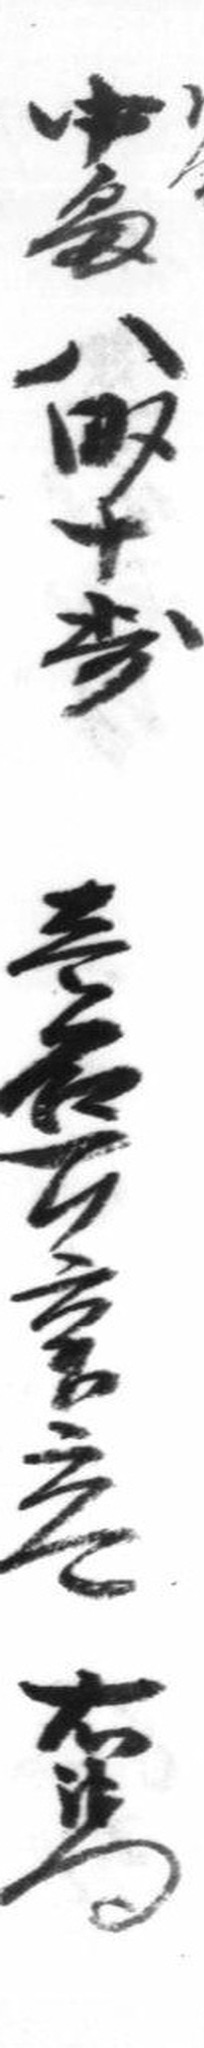中畠八畝十歩壱石一斗六升六合右衛門
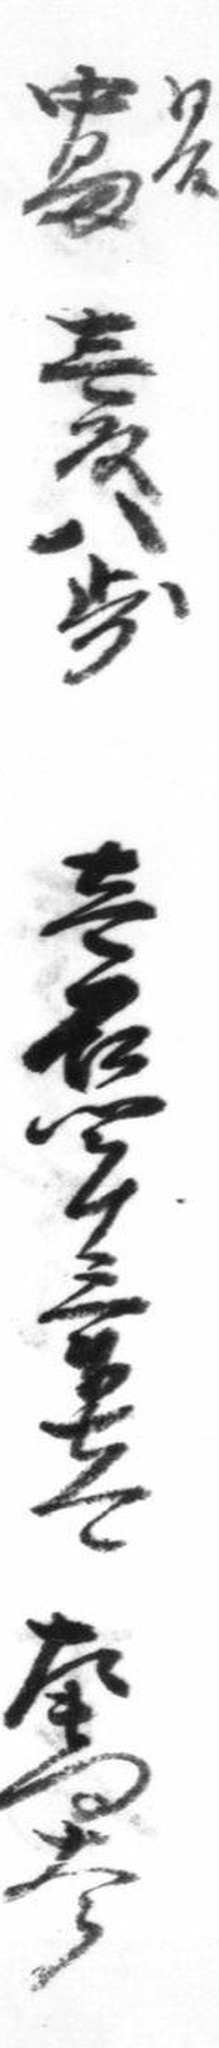中畠壱反八歩壱石四斗三升七合左衛門太郎
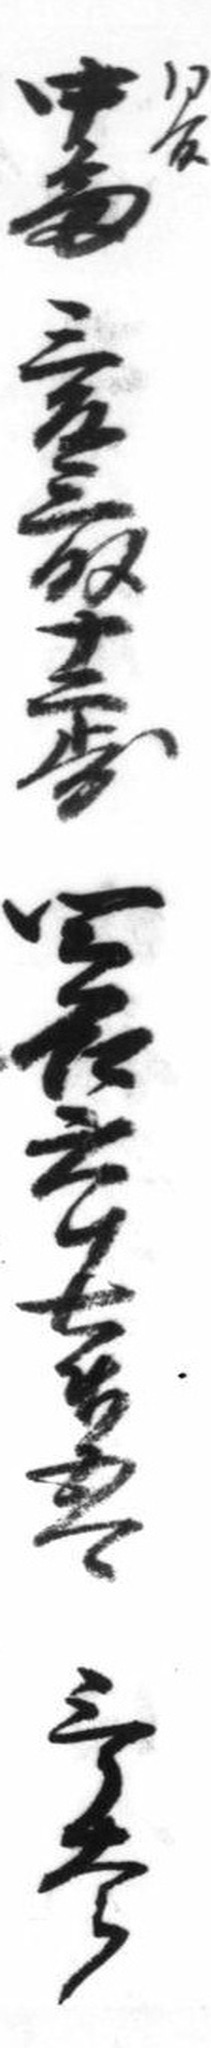中畠三反三畝十二歩四石六斗七升五合三郎太郎
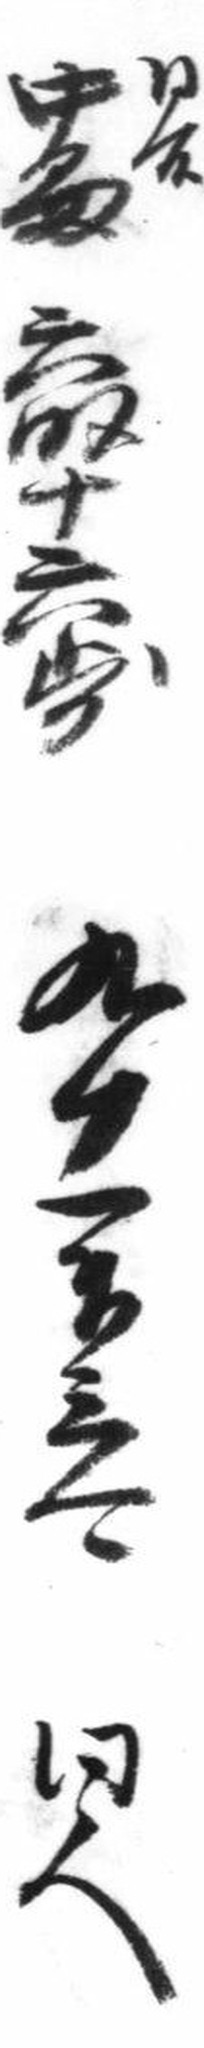中畠六畝十六歩九斗一升三合同人
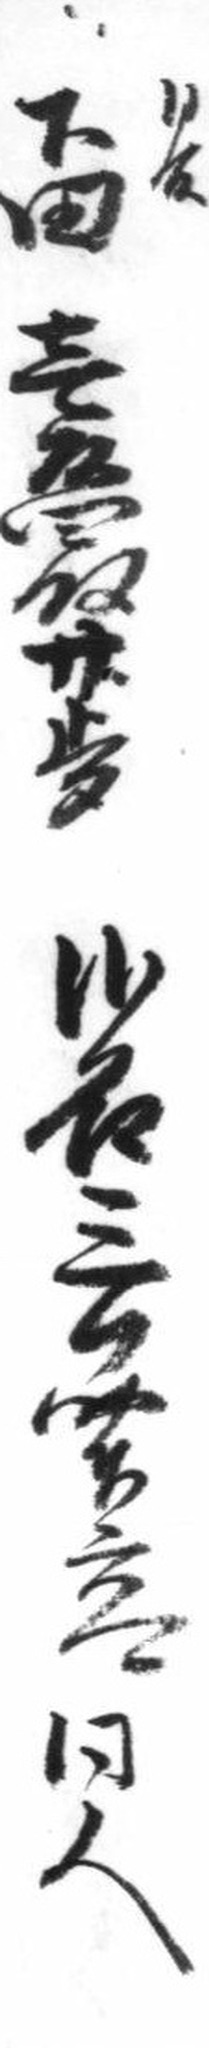下田壱反四畝廿歩弐石三斗四升六合同人
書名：越前国大野郡今井村御検地帳
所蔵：福井県文書館 Fukui Prefectural Archives
